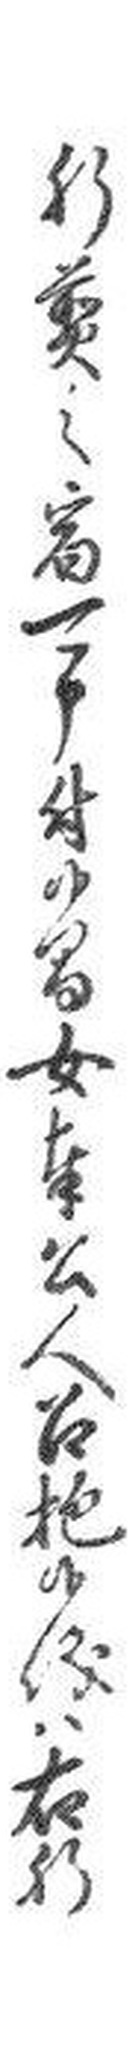肝煎之宿可申付候間女奉公人召抱候儀ハ右肝
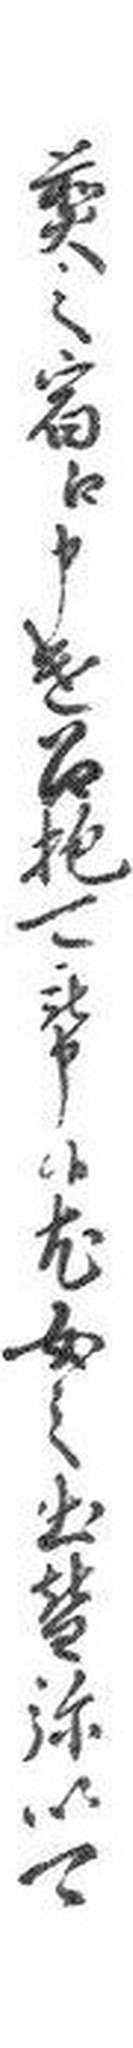煎之宿江申遣召抱可被申候尤女之出替弥以可
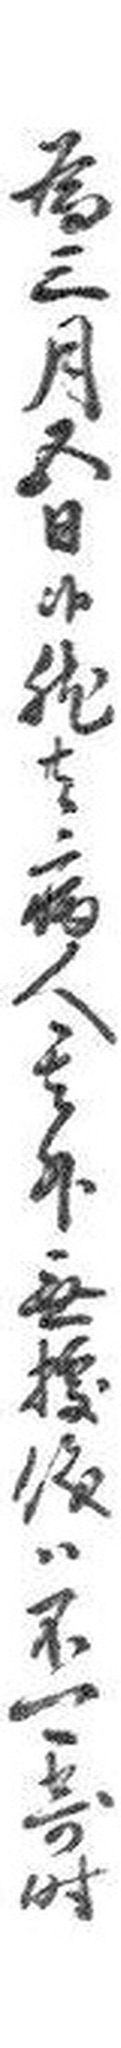為三月五日候然共病人其外無拠儀ハ不可寄時
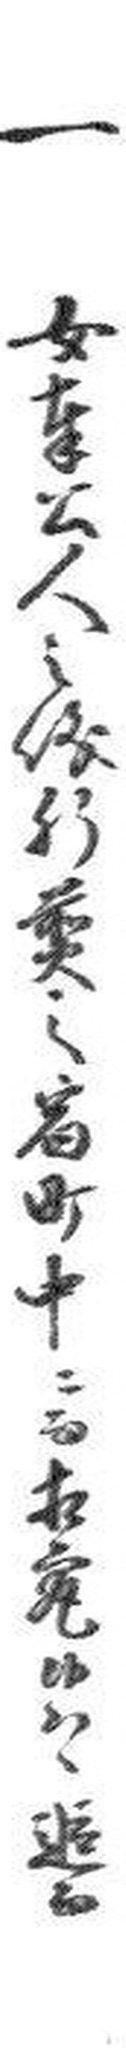一女奉公人之儀肝煎之宿町中ニ而相究候ハゝ追而
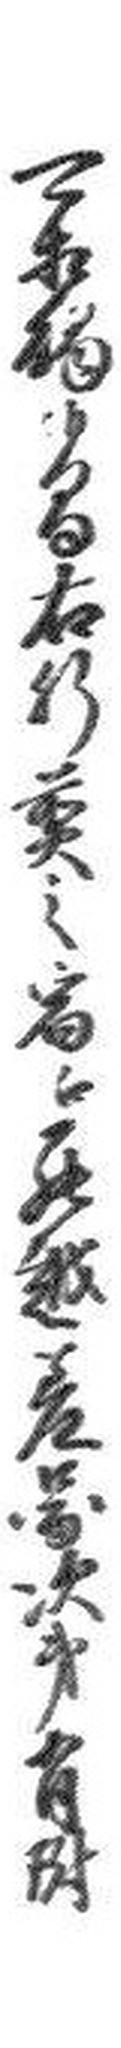可相触候間右肝煎之宿江罷越差図次第有附
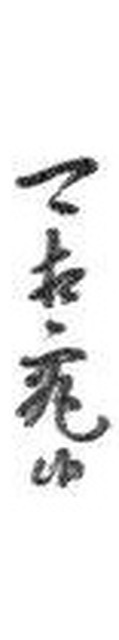可相究候
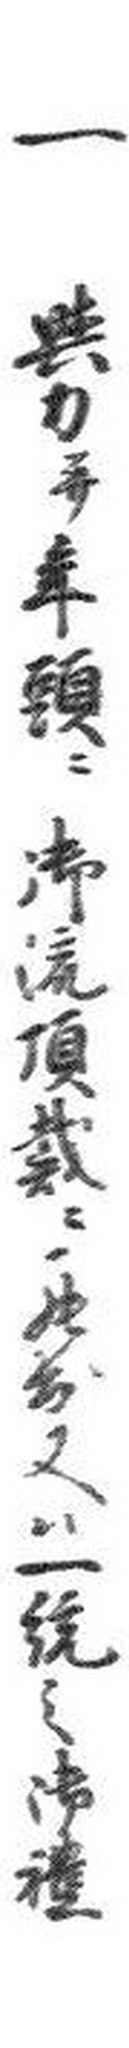一与力幷年頭ニ御流頂戴ニ罷出又は一統之御礼
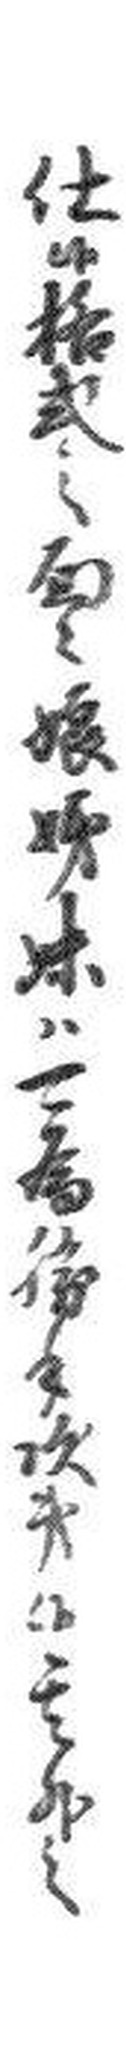仕候格式之面々娘姉妹は可為勝手次第候其外之
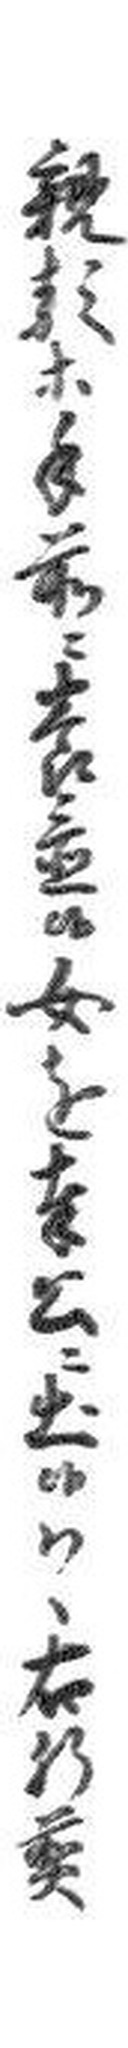親類等手前ニ養置候女を奉公ニ出候ハゝ右肝煎
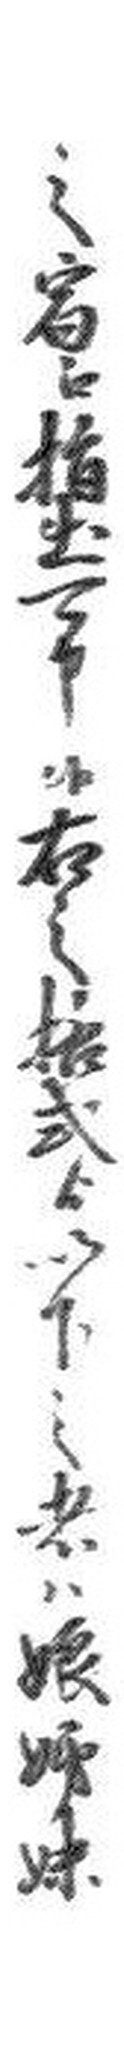之宿江指出可申候右之格式ゟ以下之者は娘姉妹
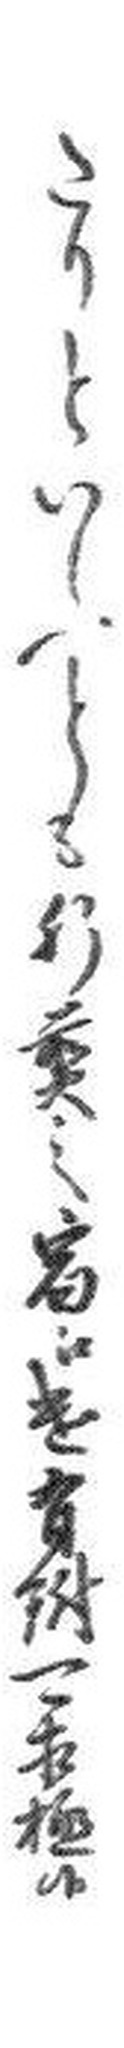たりといふとも肝煎之宿江遣有附可相極候
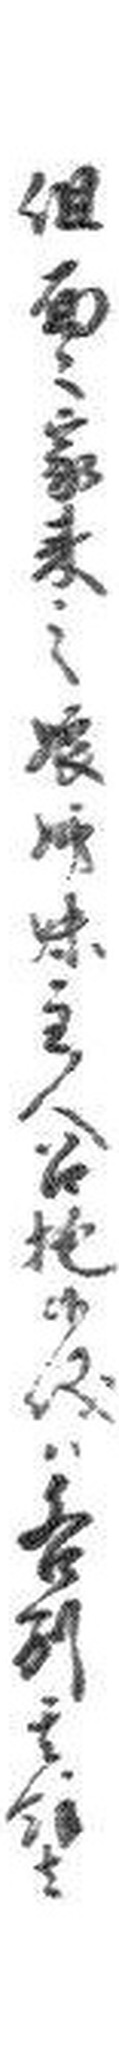但面々家来之娘姉妹主人召抱候儀は各別其余は
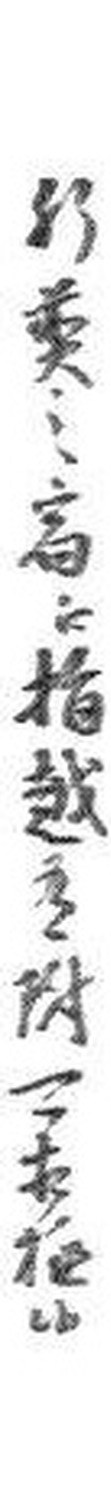肝煎之宿江指越有附可相極候

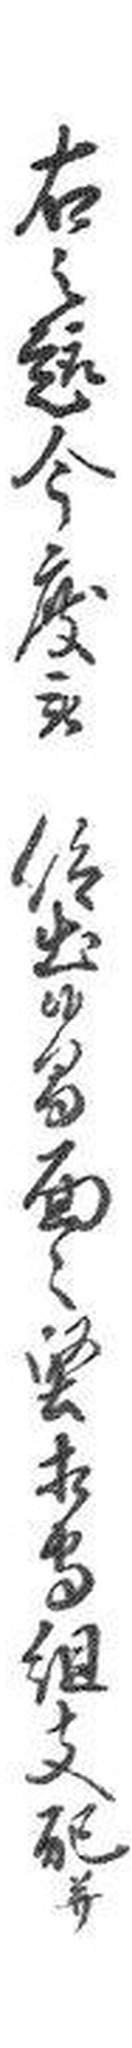右之趣今度被仰出候間面々堅相守組支配幷
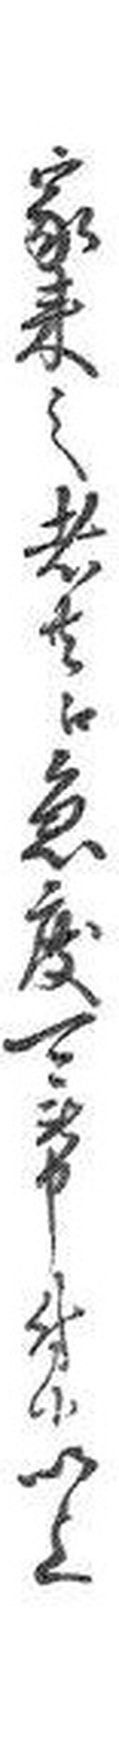家来之者共江急度可被申付候以上
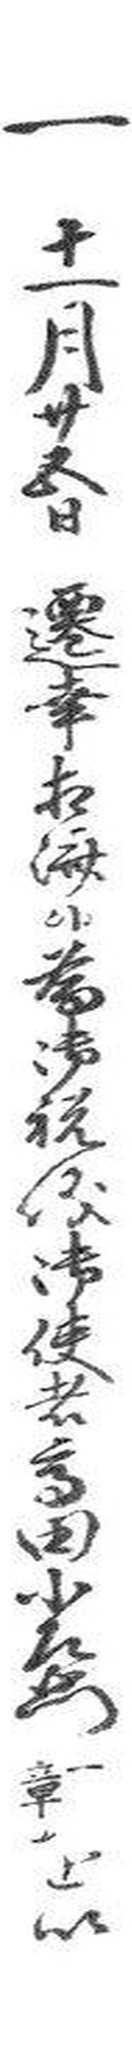一十一月廿五日遷幸相済候為御祝儀御使者高田小左衛門一章を以
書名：家譜 二十五 吉品公 従宝永六年到同七年
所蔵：福井県文書館 Fukui Prefectural Archives
